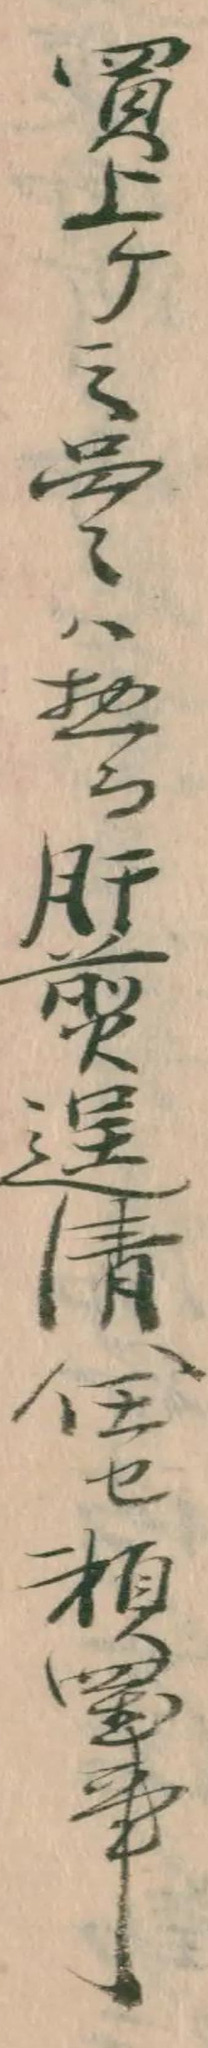買上ケ之品々ハ惣而肝煎逞清任セ頼置事
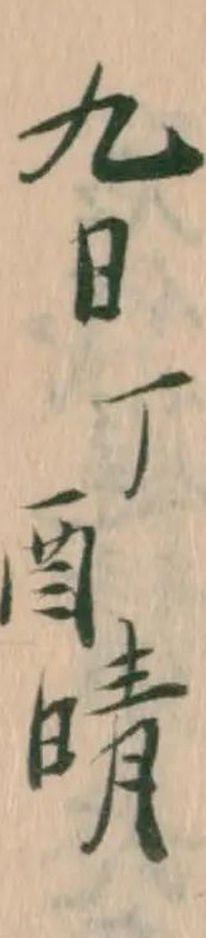九日丁酉晴
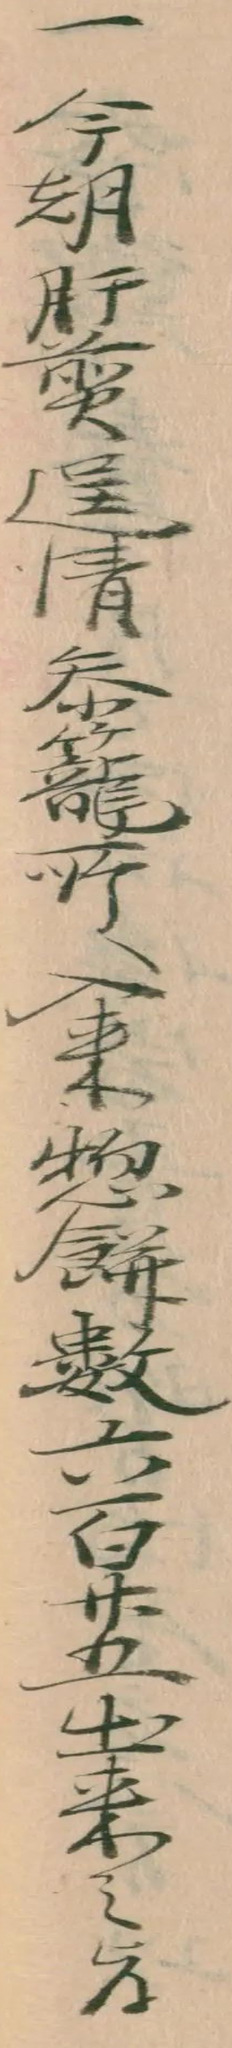一今朝肝逞清参籠所へ入来惣餅数六百廿五出来之旨
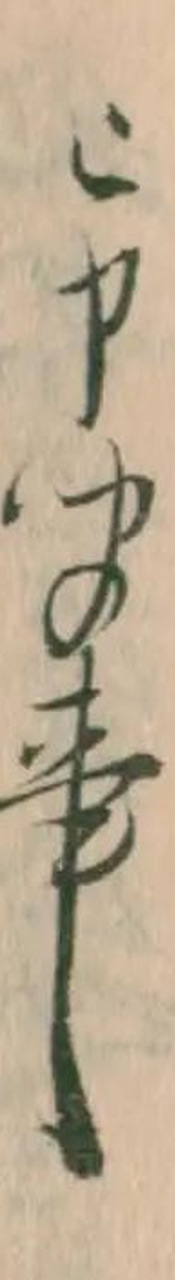被申聞事
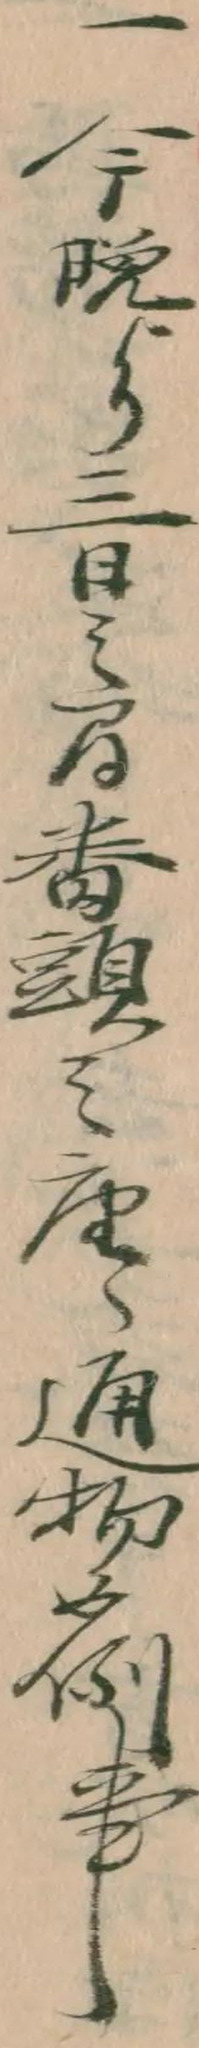一今晩より三日之間番頭之座候通物如例事
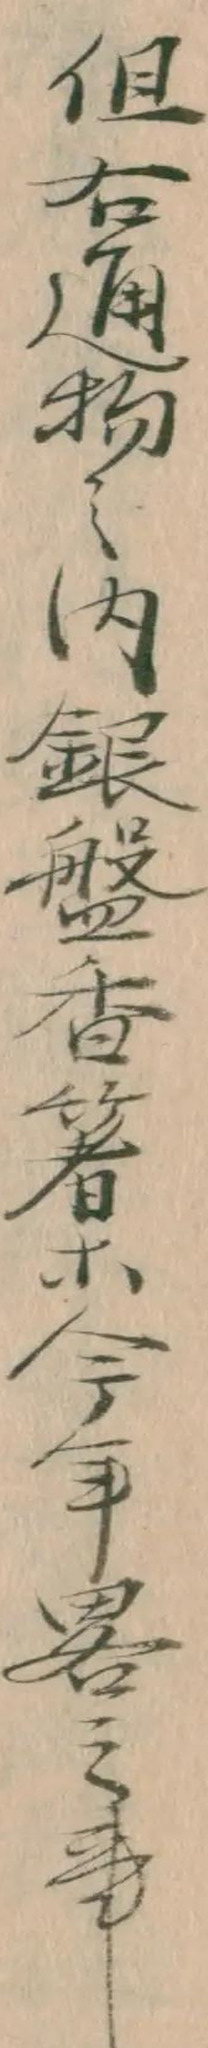但右通物之内銀盤香箸等今年畧之事
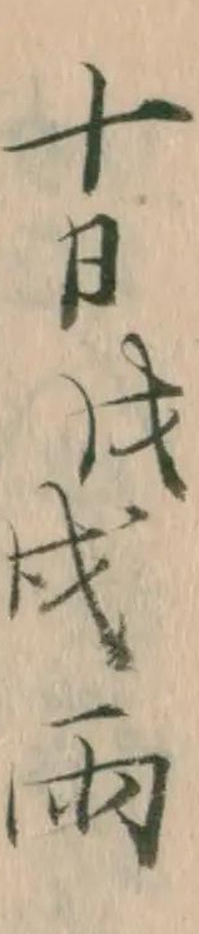十日戊戌雨
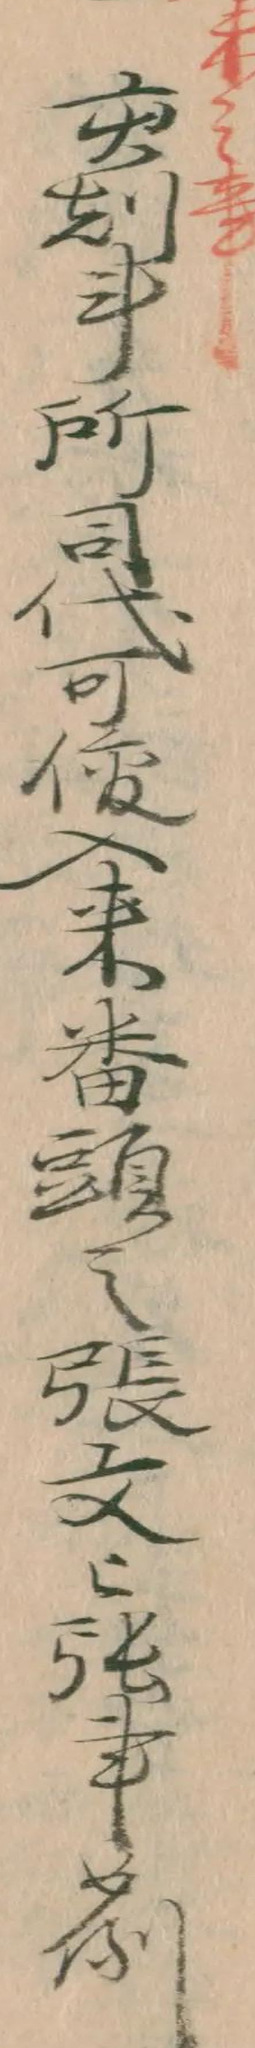一亥刻斗所司代可俊入来番頭之張文被張事如例
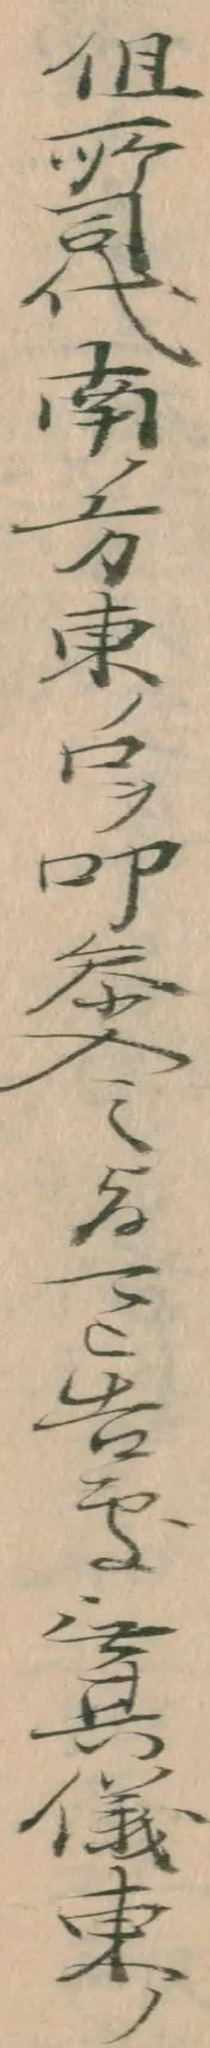但所司代南の方東ノ口ヲ叩参入之旨可被告處無其儀東ノ
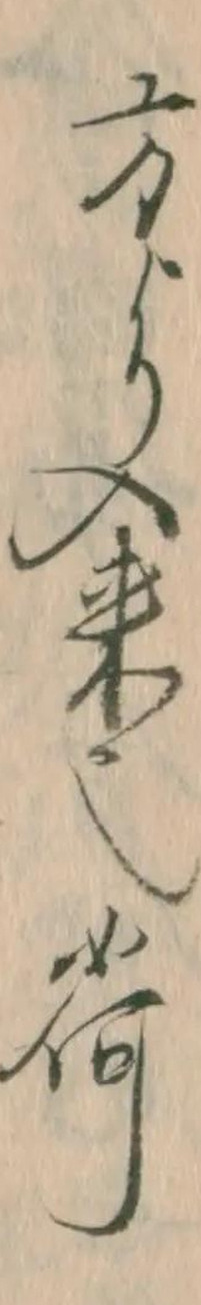方より入来也如何
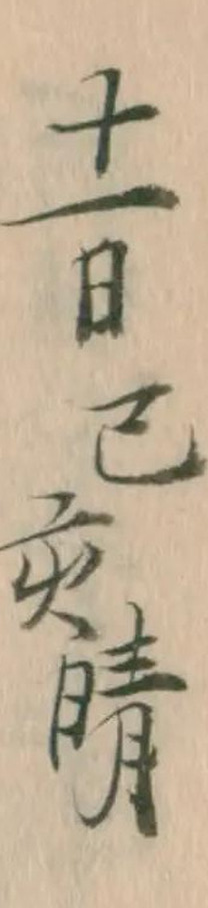十一日己亥晴
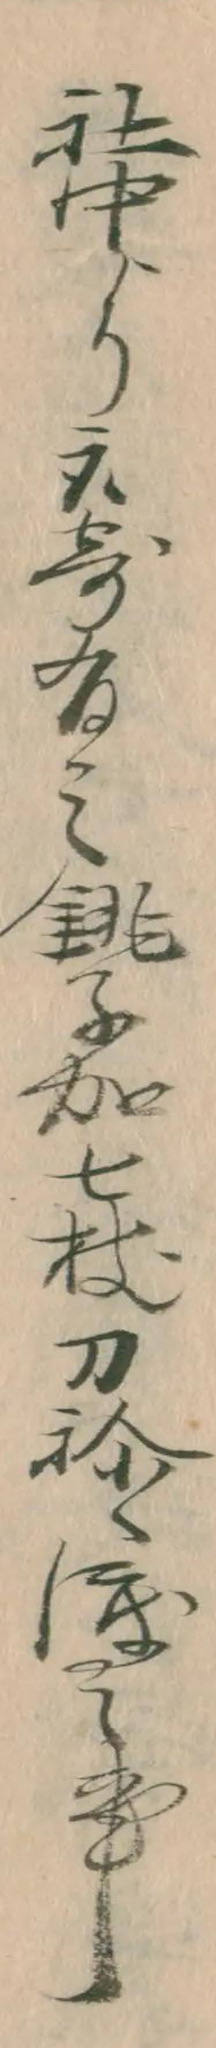一社中より取寄有之銚子加七杖刀祢へ渡之事
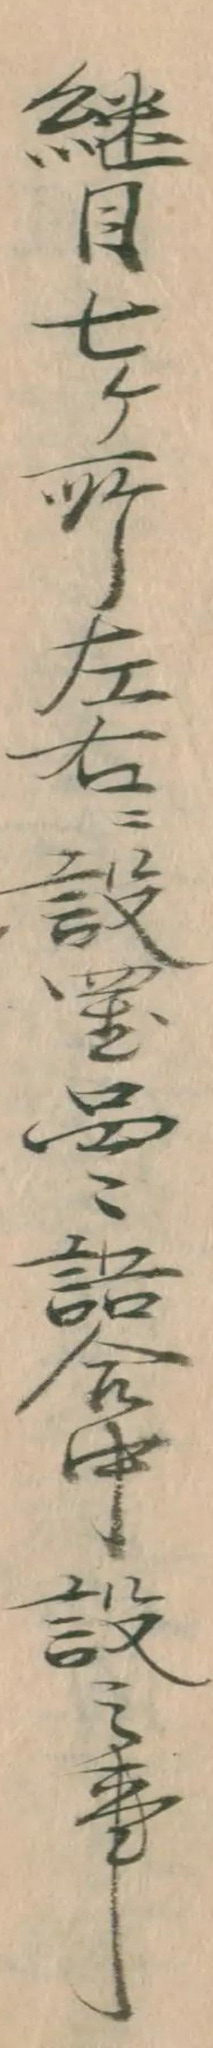一継目七ヶ所左右に設置品々語合中設之事

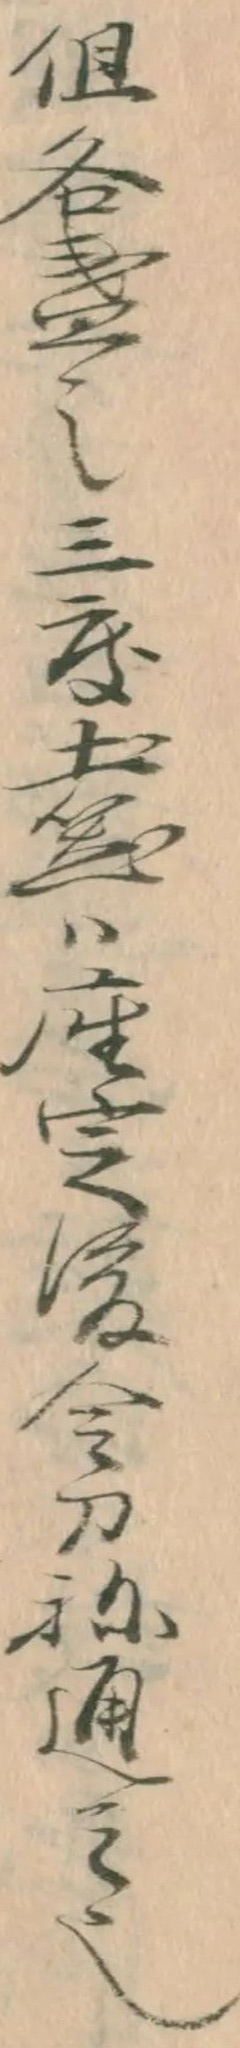但各盞也三度土器御座定後令刀祢通之也
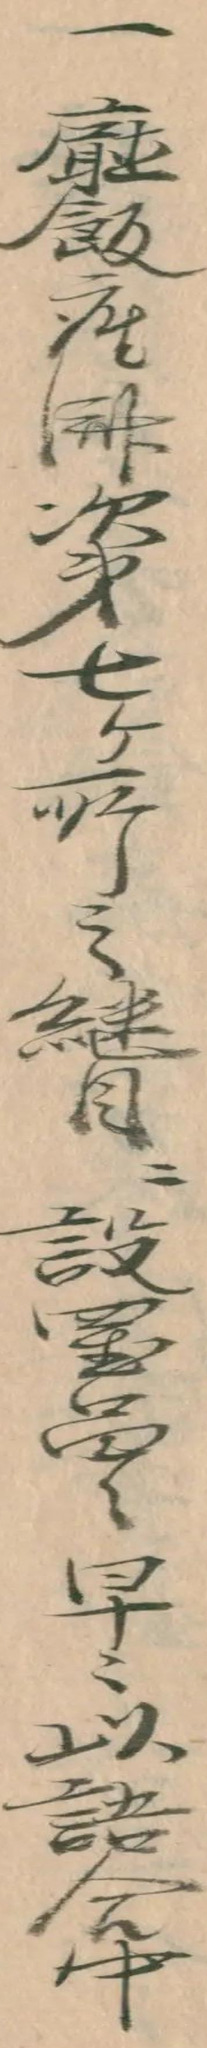一廳飯座済次第七ヶ所之継目ニ設置品々早々以詰合中
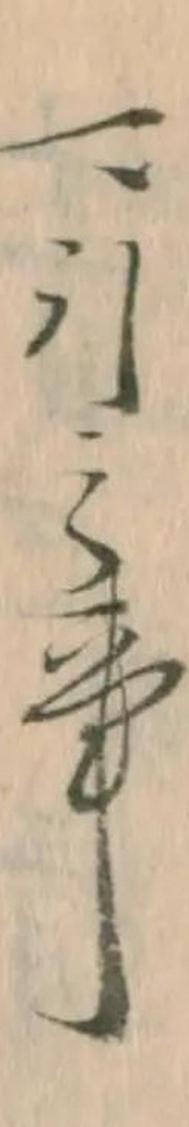可引之事
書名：賀茂社記録. 第74冊
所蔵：国立国会図書館 National Diet Library, JAPAN
